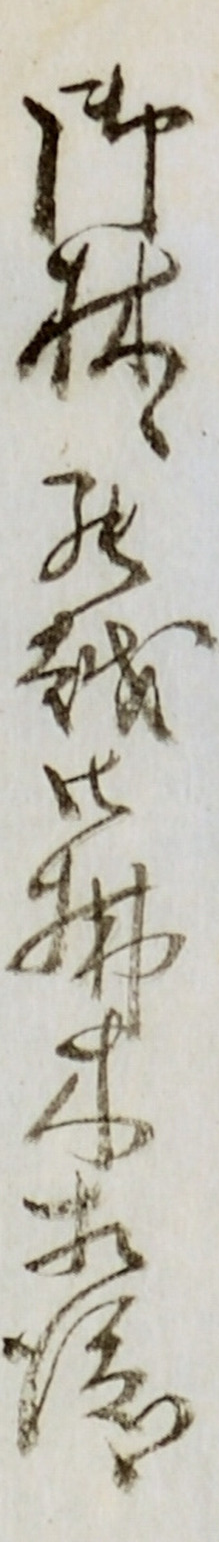御林へ罷越御払木相渡候
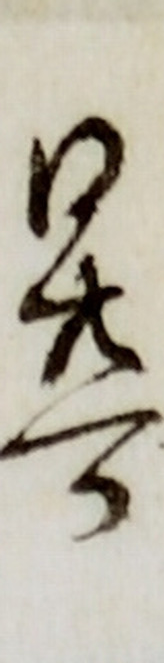同廿一日
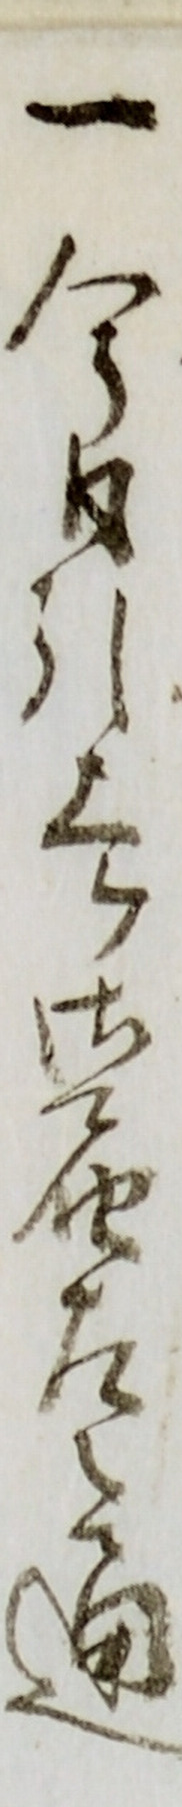一今日引上ケ御届左之通
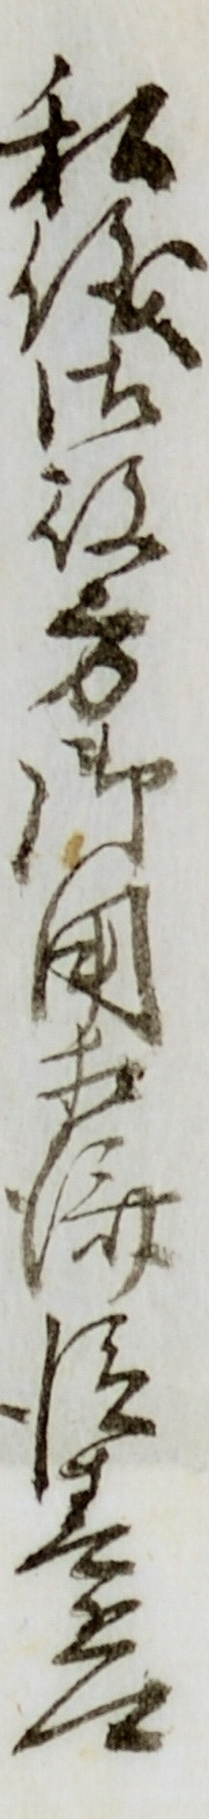私儀御役方御用相済従春近郷
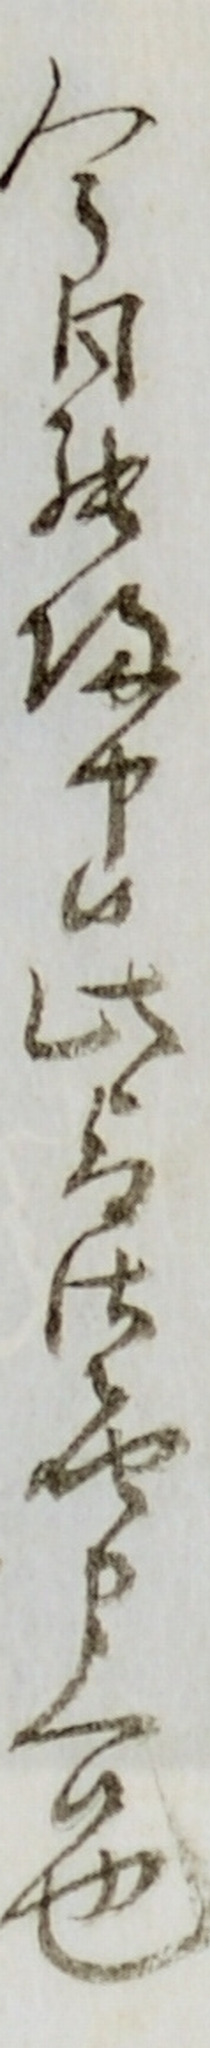今日罷帰申候此旨御届申上候也
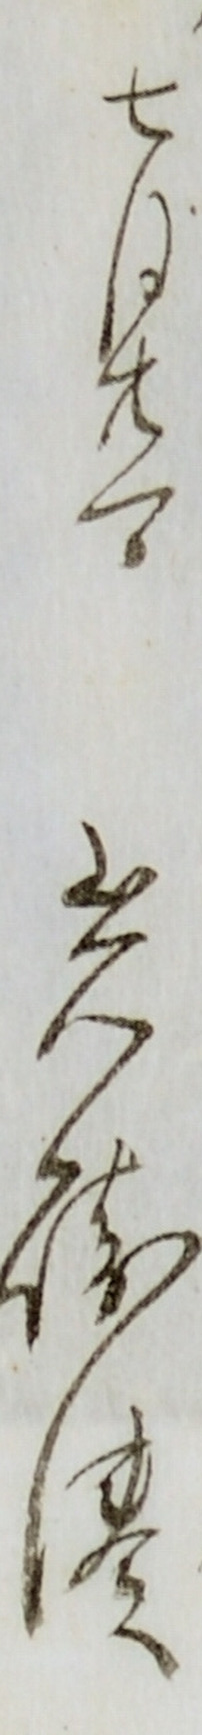七月廿一日岩崎湊

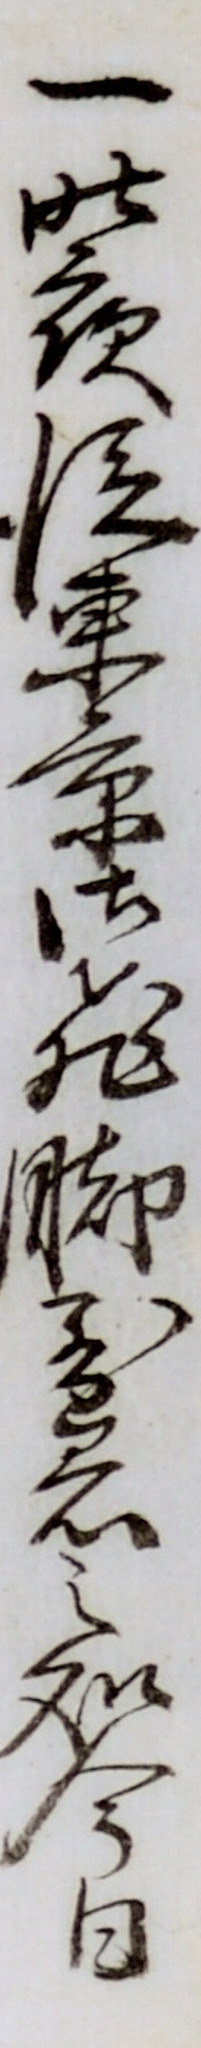一昨夜従東京御飛脚到着之処今日
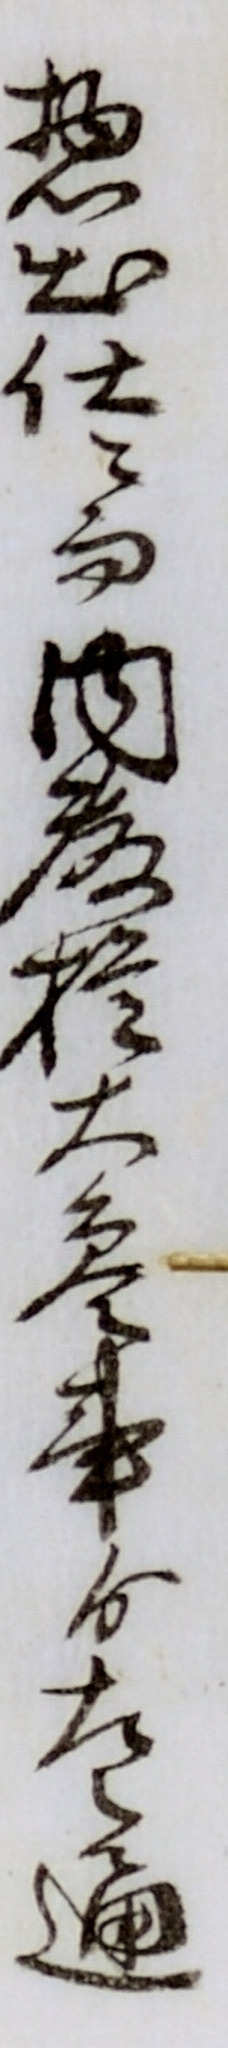惣出仕にて内藤権大参事ゟ左之通
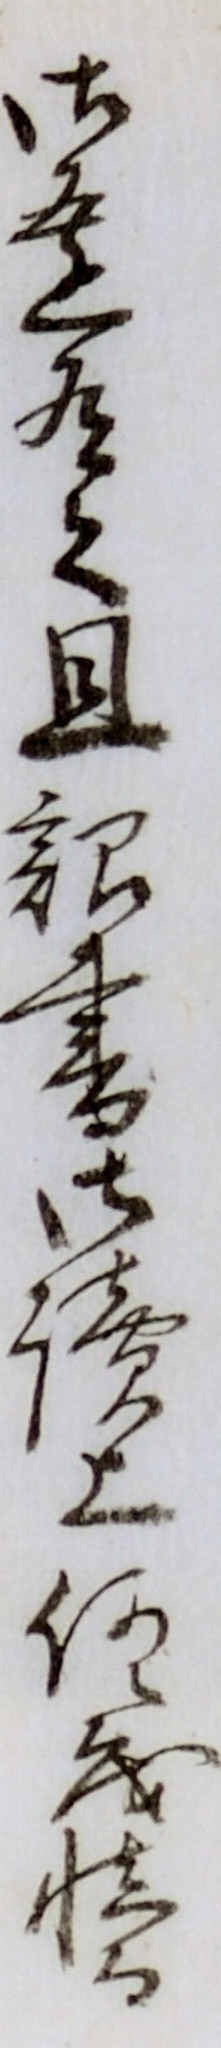御達有之且親書御読上何レも慎て
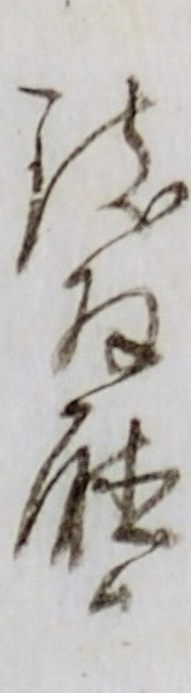致拝聴候
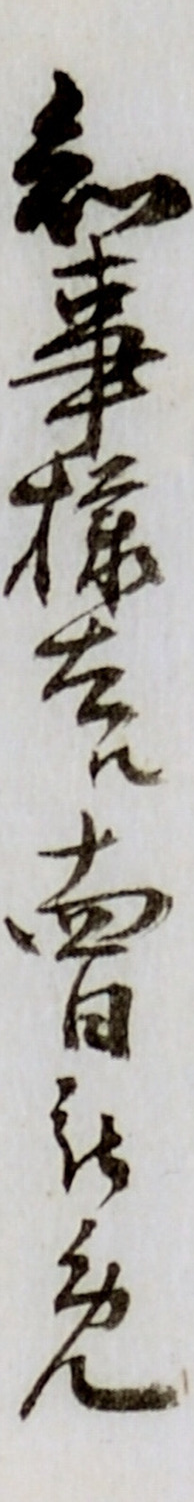知事様去ル十四日被免
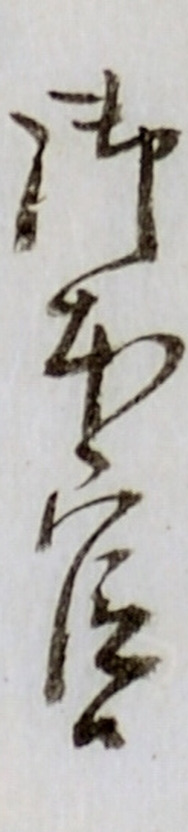御本官候
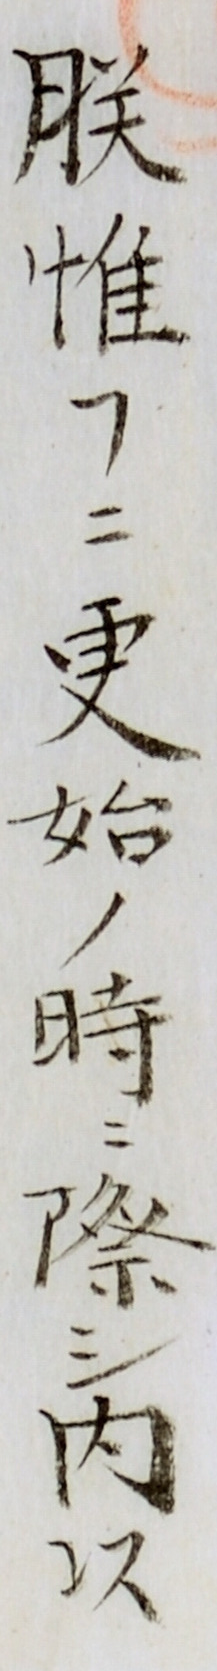朕惟フニ更始ノ時ニ際シ内以
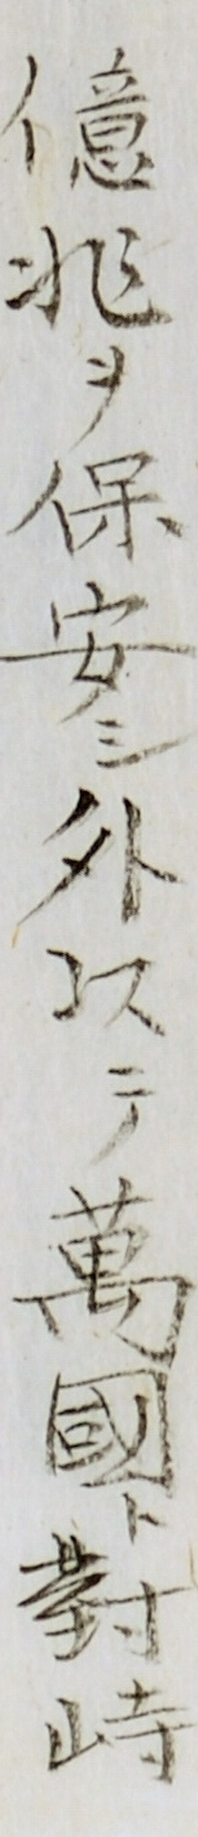億兆ヲ保安シ外以テ万国ト対峙
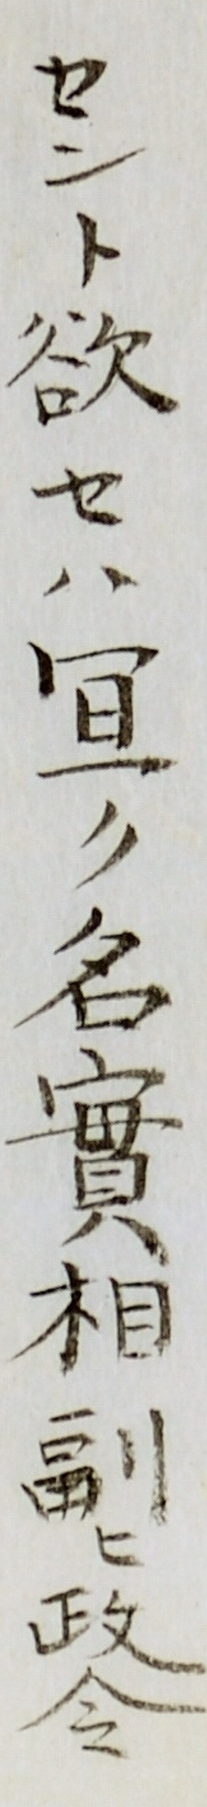セント欲セハ宜ク名実相副ヒ政令
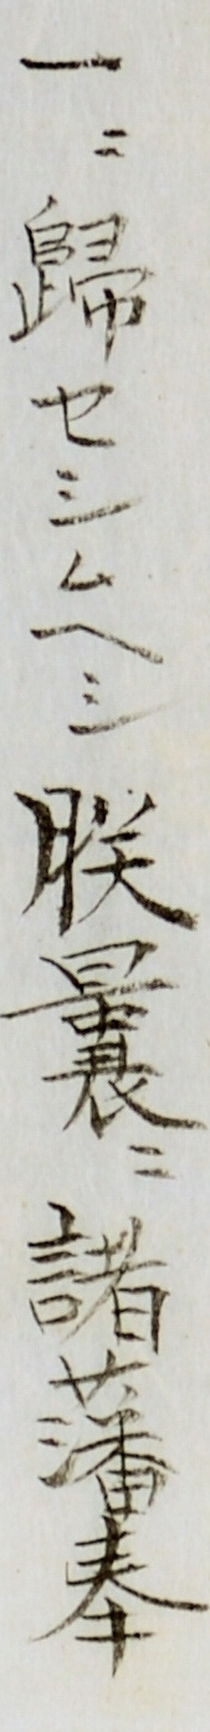一ニ帰セシムヘシ朕曩ニ諸藩奉
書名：山林方諸事御用留
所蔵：伊那市立高遠町図書館・合同会社AMANE
